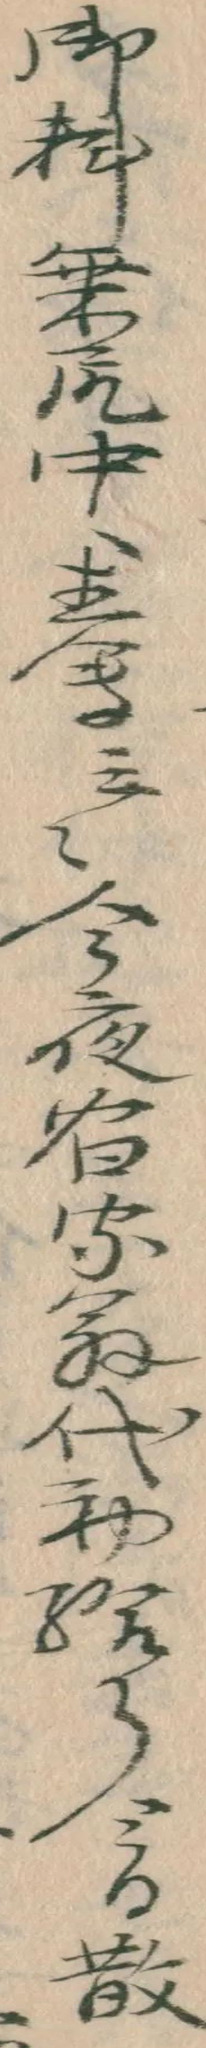御料乗尻中へ直会云々今夜宿家翁代勤給了今日散
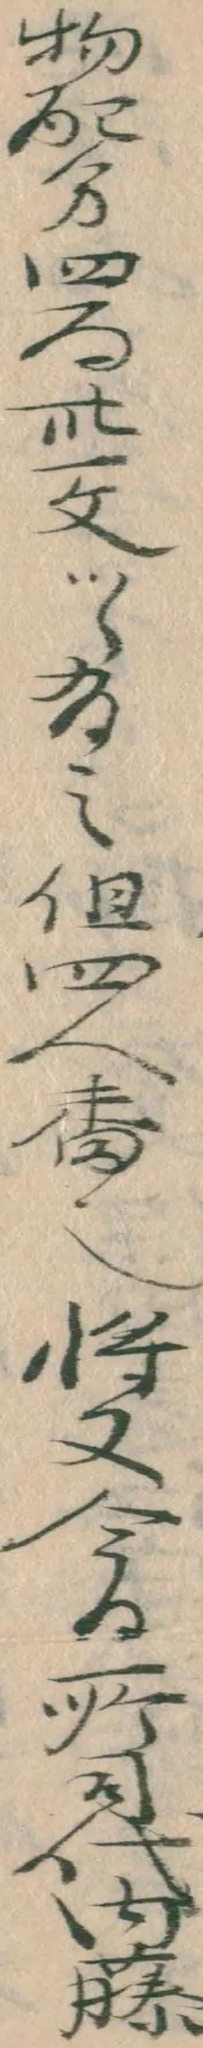物配分四百丗一文ツヽ有之但四人番也将又今日所司代内藤
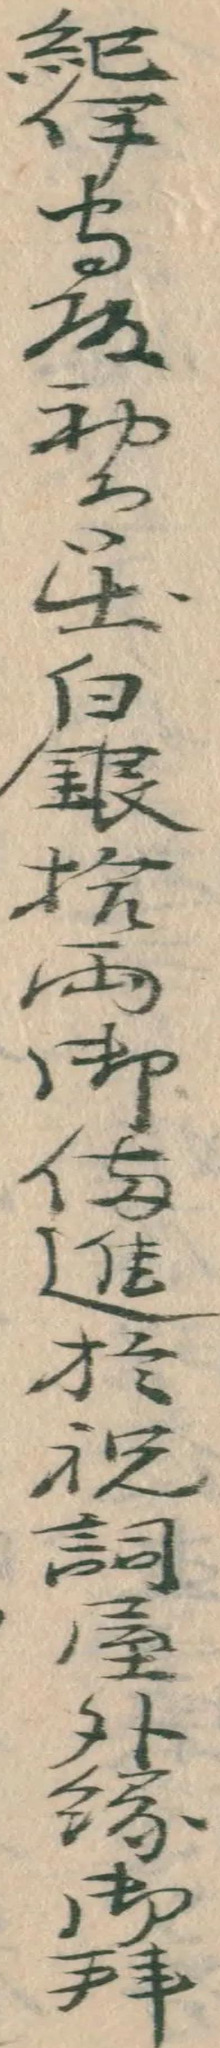紀伊守殿初而御出白銀拾両御備進於祝詞屋外縁御拝
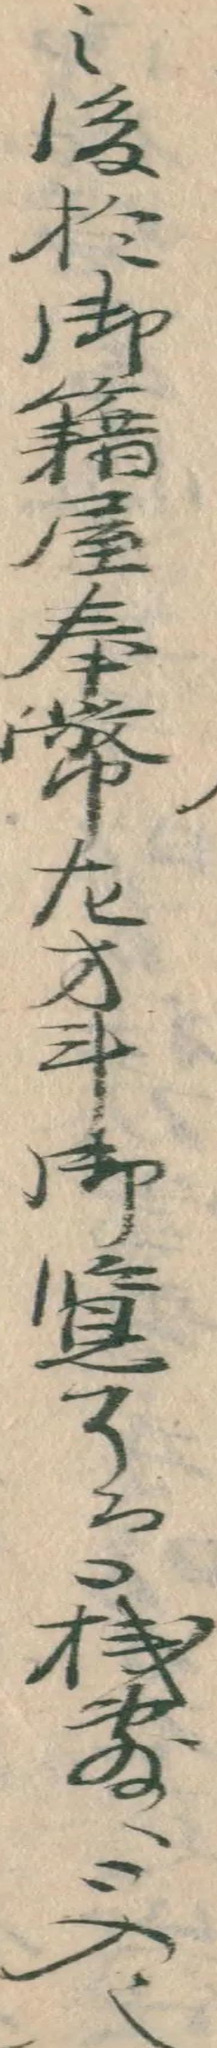之後於御籍屋奉幣左方計御覧了而御桟敷へ御入也
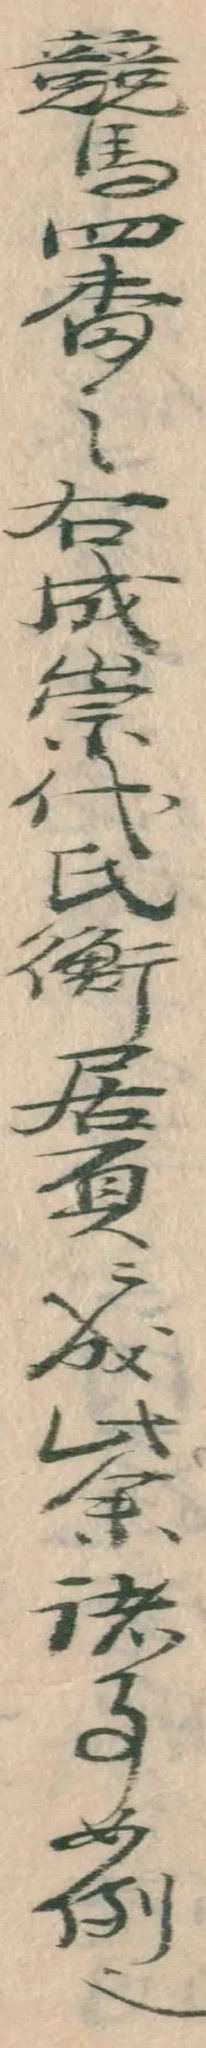競馬四番之右成崇代氏衡居負に成此余諸事如例也
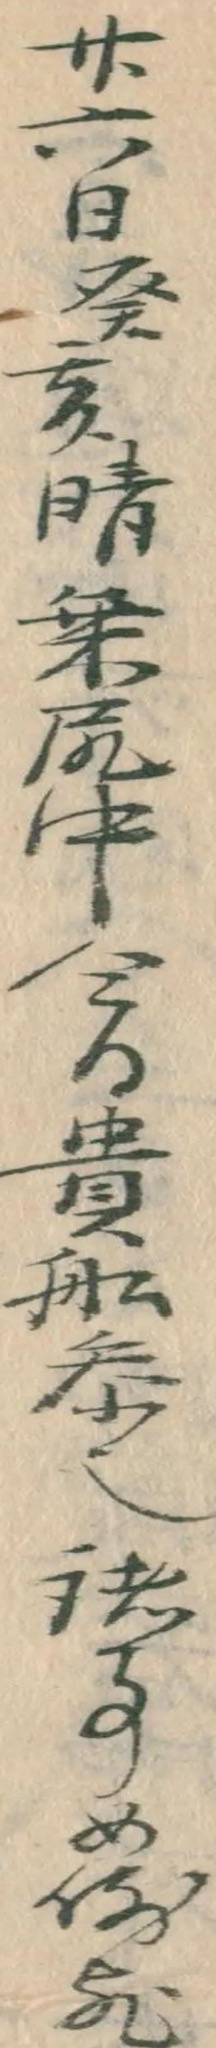廿六日癸亥晴乗尻中今日貴船参也諸事如例歟
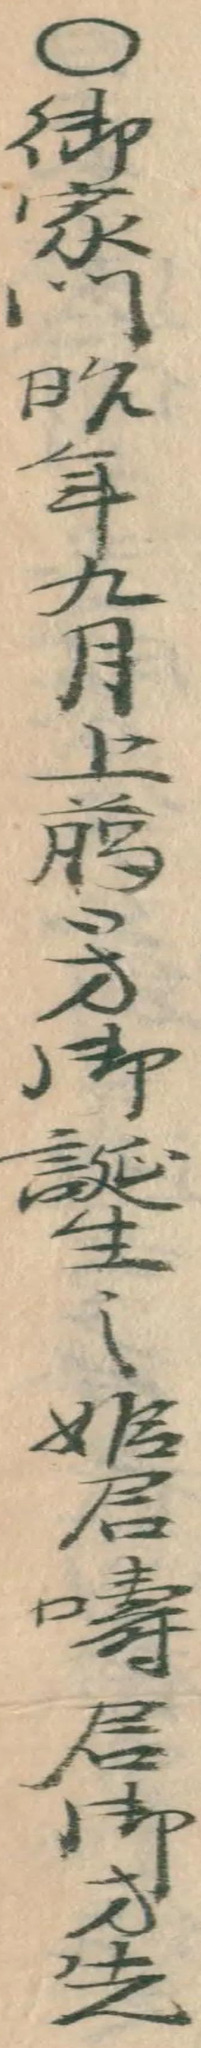○御家門昨年九月上臈御方御誕生之姫君嚋君御方先

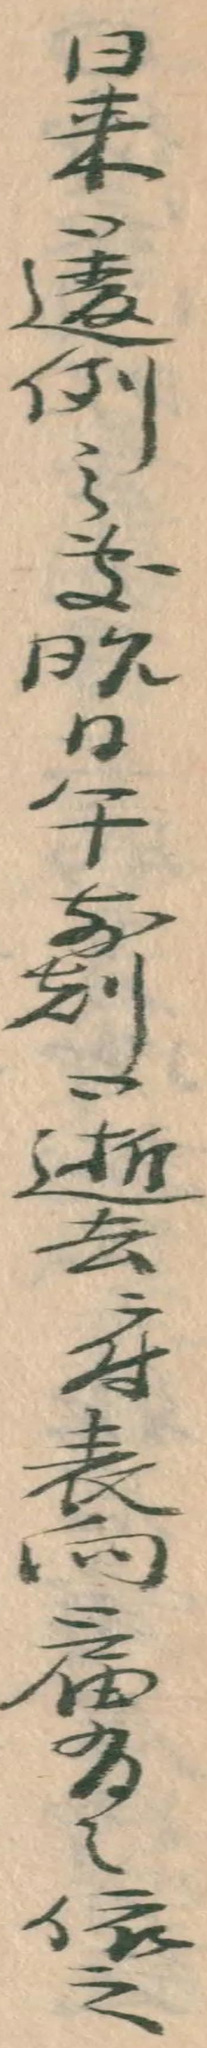日来御違例之処昨日午前刻御逝去ニ付表向御届有之依之
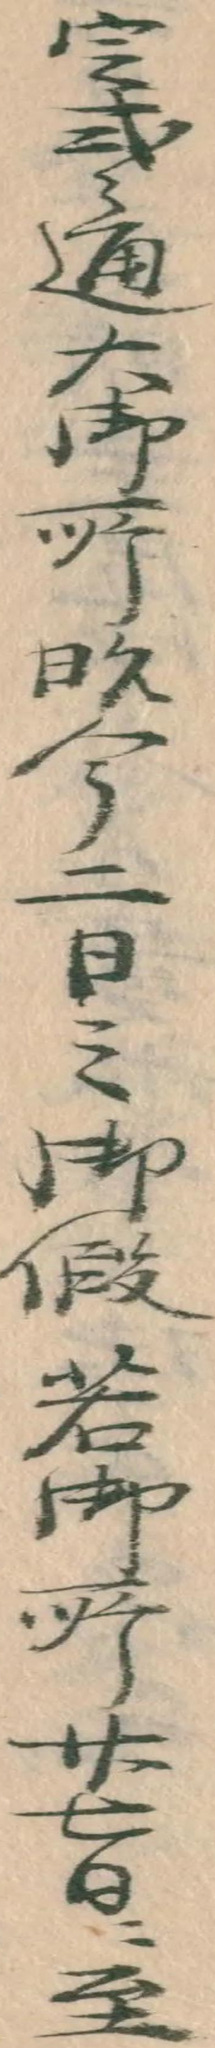定式之通大御所昨今二日之御假若御所廿七日ニ至
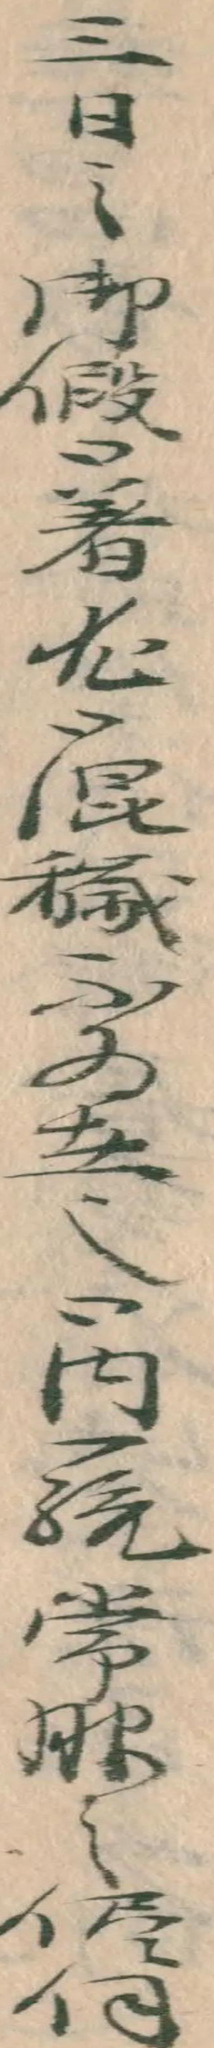三日之御假御着尤御混穢不為在也御内一統常服之侭伺
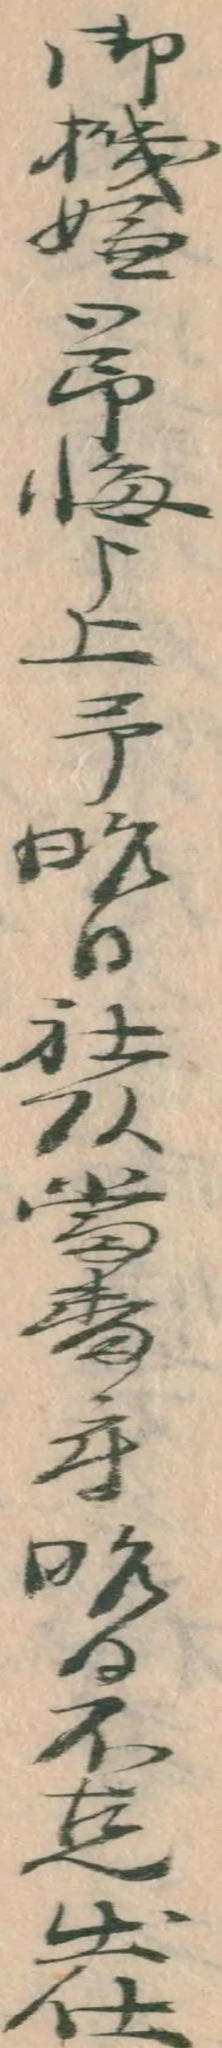御機嫌御弔悔申上予昨日社頭当番ニ付昨日不克？出仕
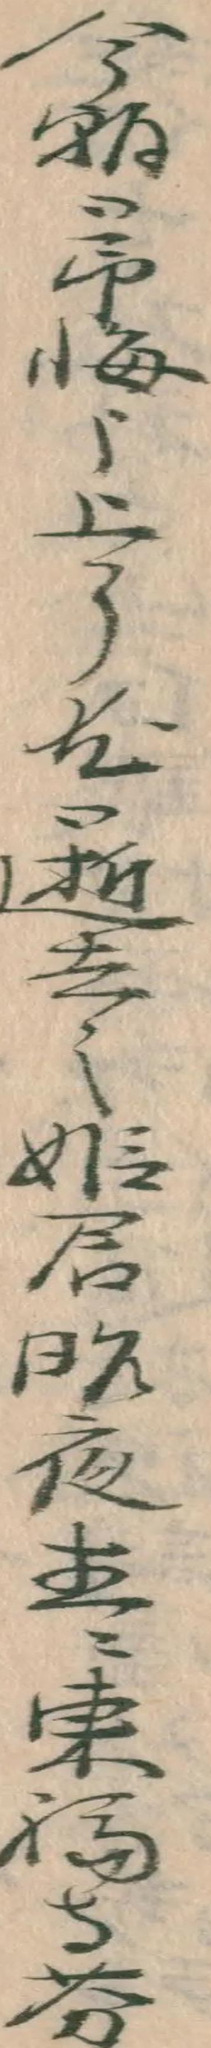今朝御弔悔申上了尤御逝去之姫君昨夜直ニ東福寺芬
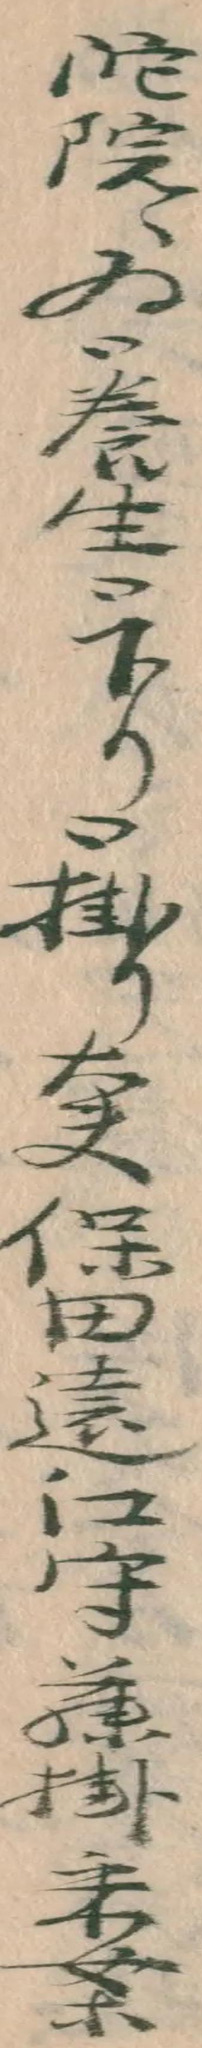陀院へ為御養生御下り御掛り大夫保田遠江守藤掛采女等
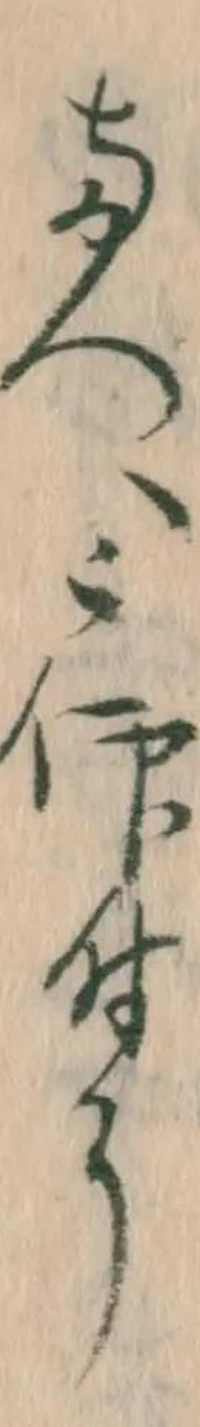両人へ被仰付了
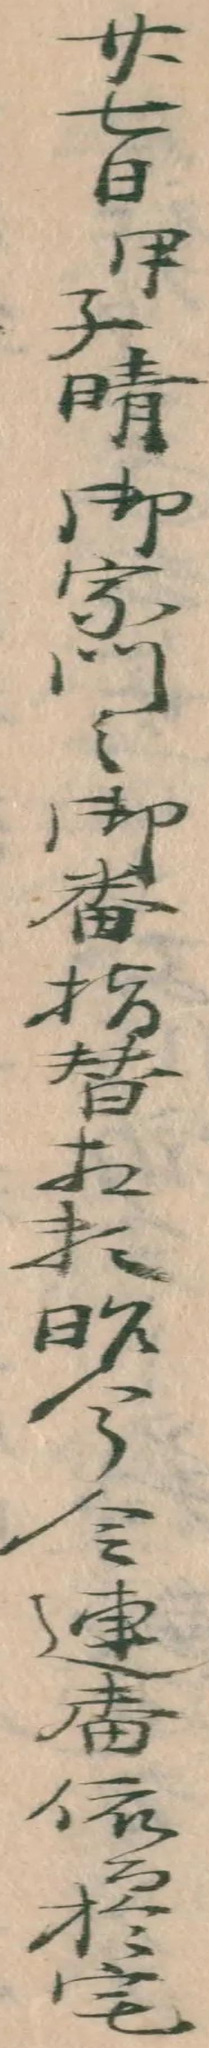廿七日甲子晴御家門之御番指替相頼昨今令連番依而於宅
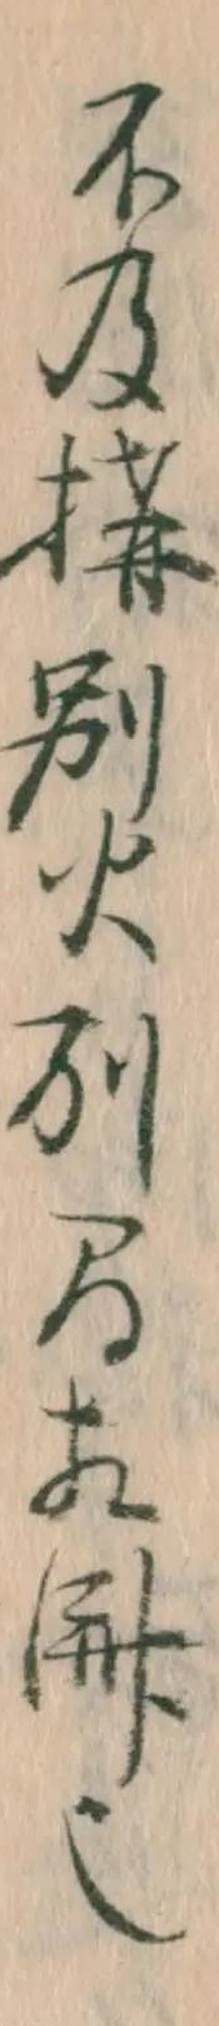不及構別火別間相済也
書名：賀茂社記録. 第64冊
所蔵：国立国会図書館 National Diet Library, JAPAN
